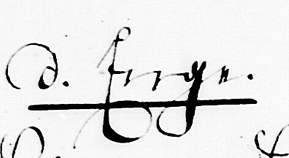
d. Enge.
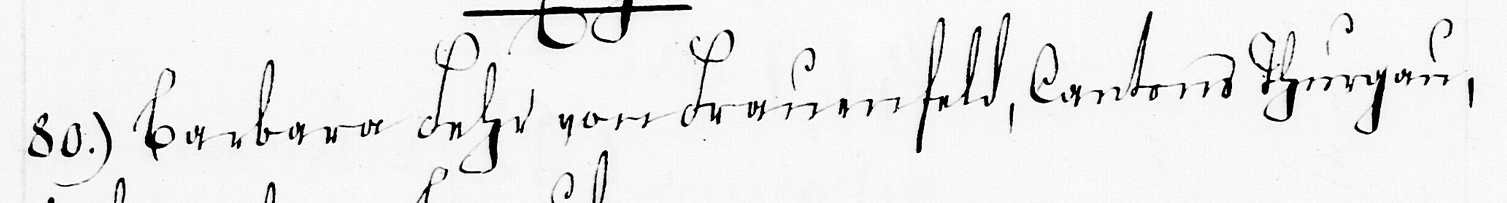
80.) Barbara Fehr von Frauenfeld, Cantons Thurgau,
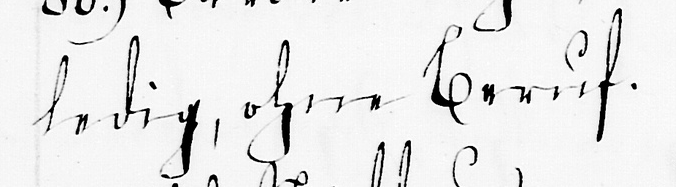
ledig, ohne Beruf.
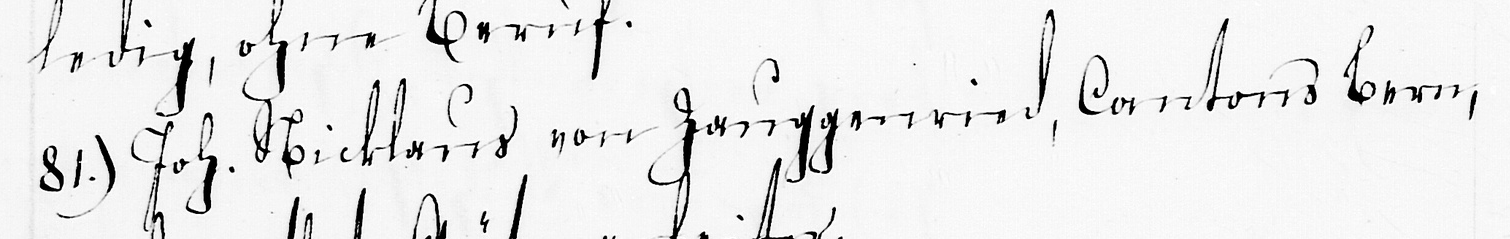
81.) Joh. Nicklaus von Zauggenried, Cantons Bern,
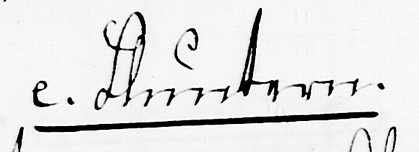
e. Fluntern.
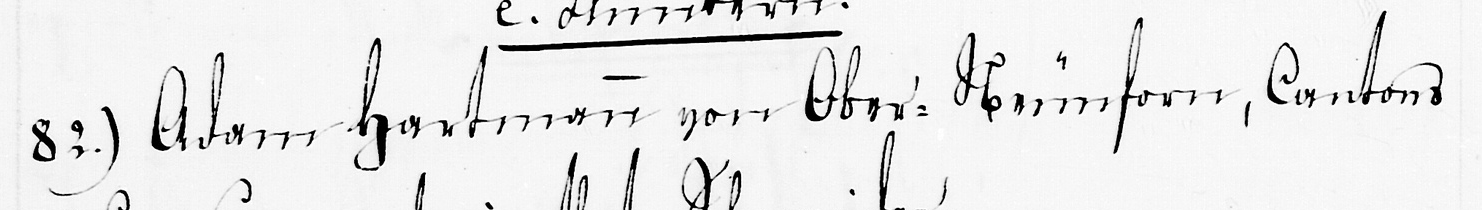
82.) Adam Hartmann von Ober-Neunform, Cantons
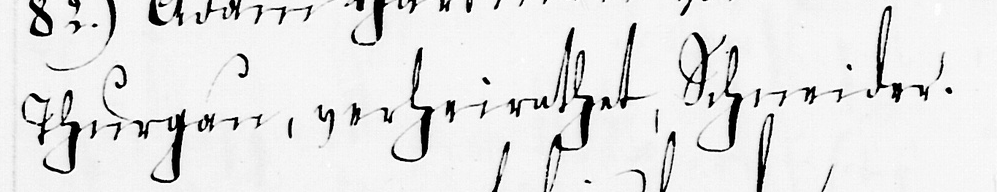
Thurgau, verheirathet, Schneider.
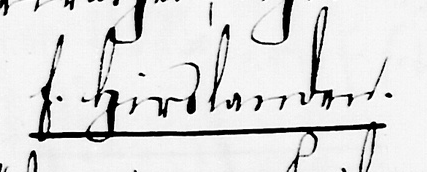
f. Hirslanden.
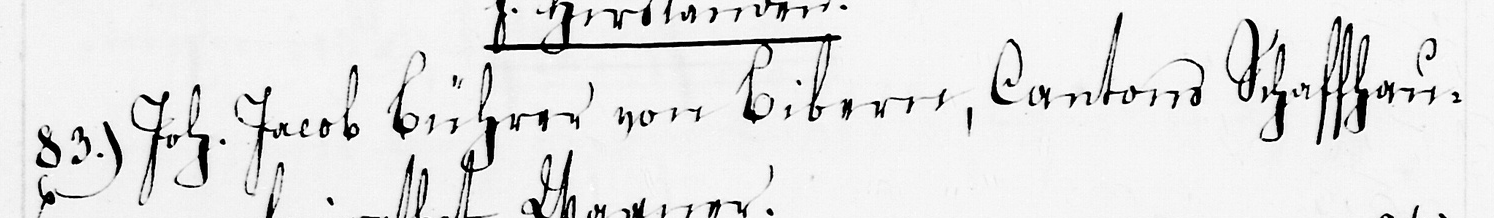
83.) Joh. Jacob Bührer von Bibern, Cantons Schaffhau¬
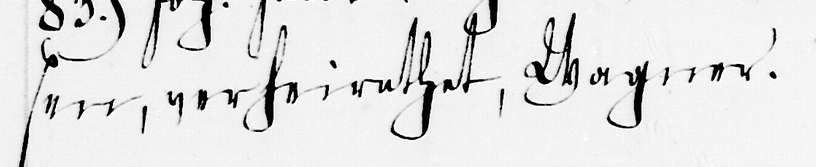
sen, verheirathet, Wagner.
